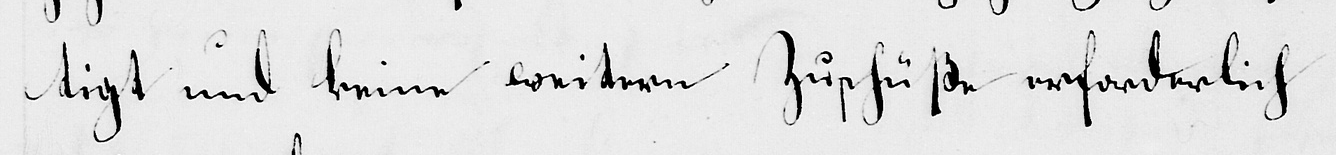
tigt und keine weitern Zuschüße erforderlich
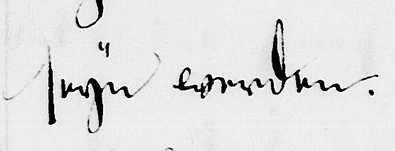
seyn werden.
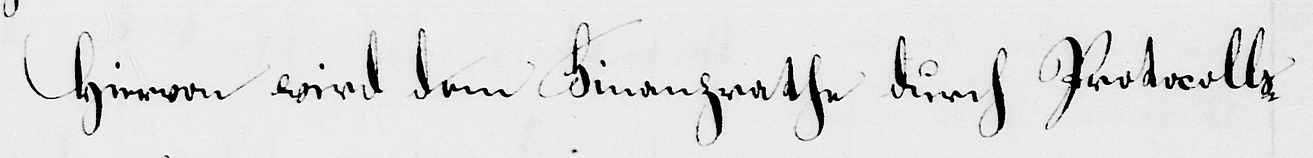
Hiervon wird dem Finanzrathe durch Protocolls¬
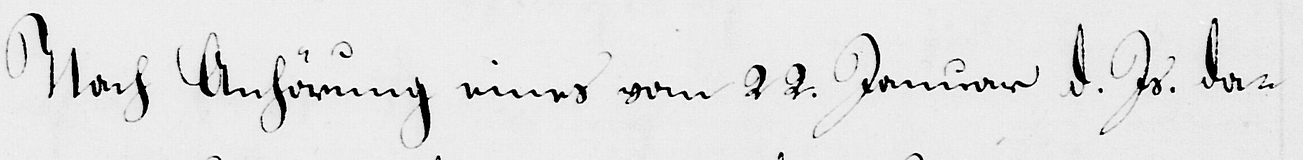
Nach Anhörung eines vom 22. Januar d. Js. da¬
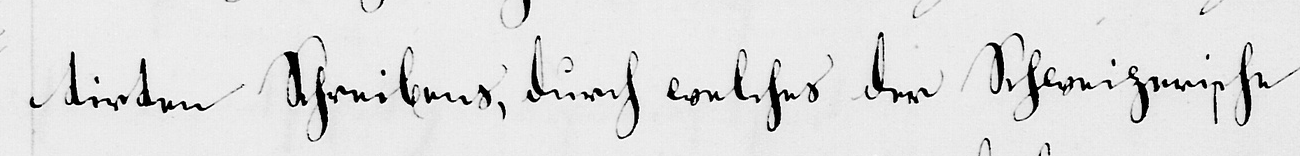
tirten Schreibens, durch welches der Schweizerische
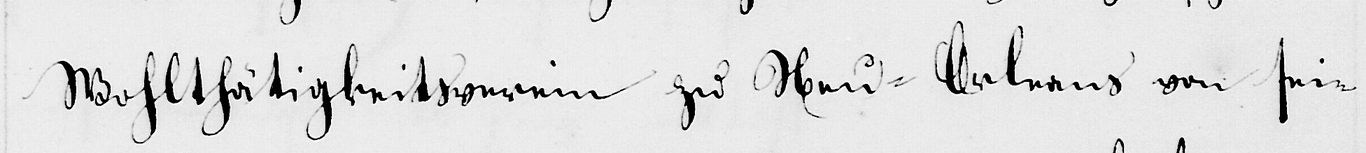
Wohlthätigkeitsverein zu Neu-Orleans von sei¬
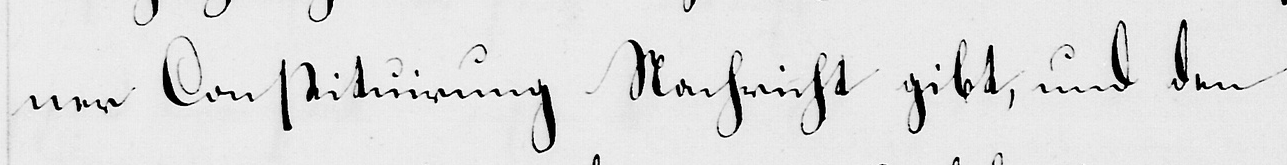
ner Constituirung Nachricht gibt, und den
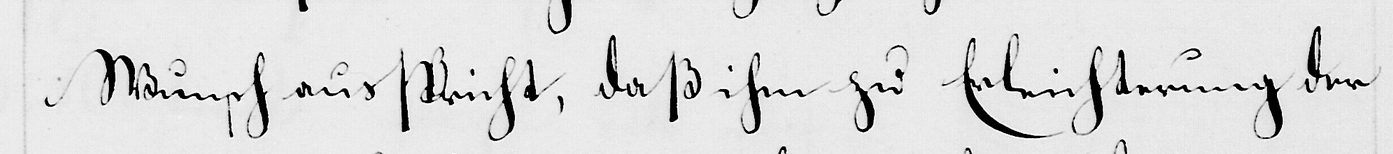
Wunsch ausspricht, daß ihm zu Erleichterung der
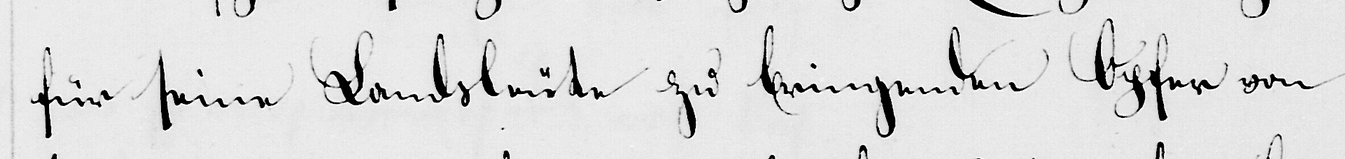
für seine Landsleute zu bringenden Opfer von
